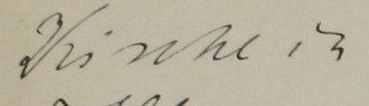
Kirche in
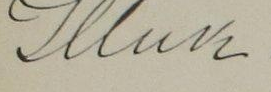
Illuk
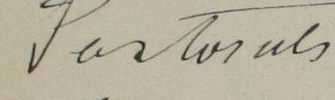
Pastorats
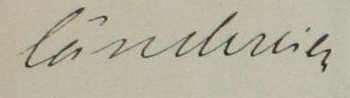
ländereien
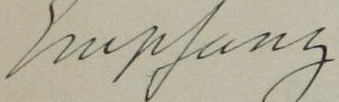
Empfang
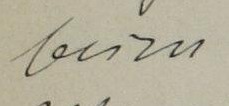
beim
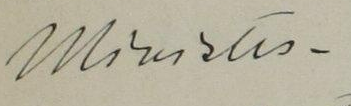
Minister-
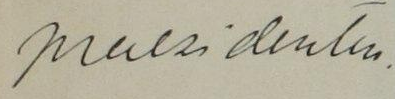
praesidenten
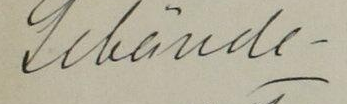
Gebäude-
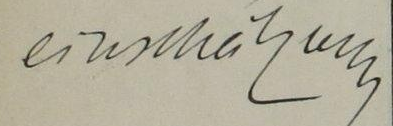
einschätzung
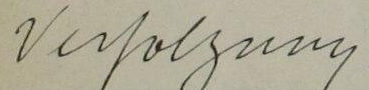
Verfolgung
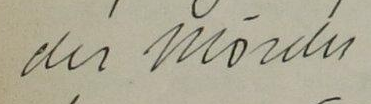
der Mörder
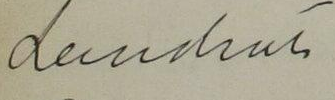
Landrats
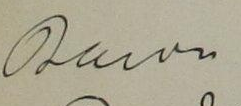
Baron
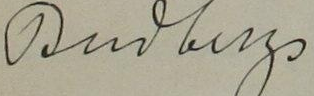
Budbergs
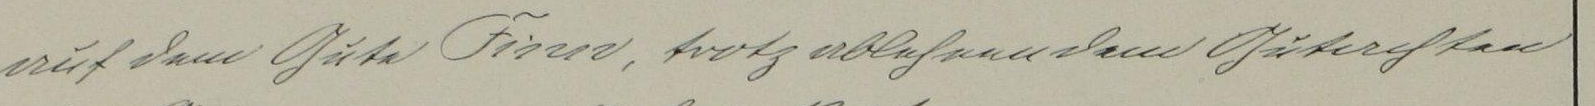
auf dem Gute Finn, trotz ablehnendem Gutachten
